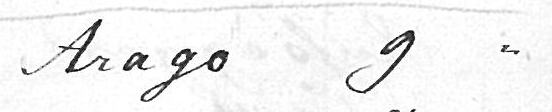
Arago 9 "
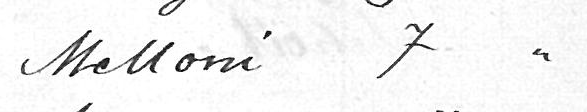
Melloni 7 "
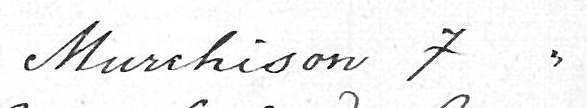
Murchison 7 "
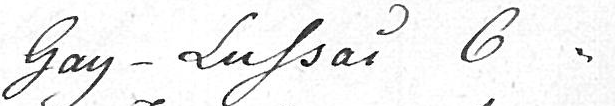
Gay-Lussac 6 "
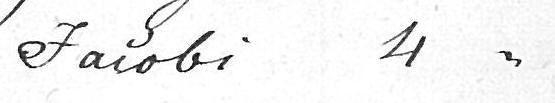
Jacobi 4 "
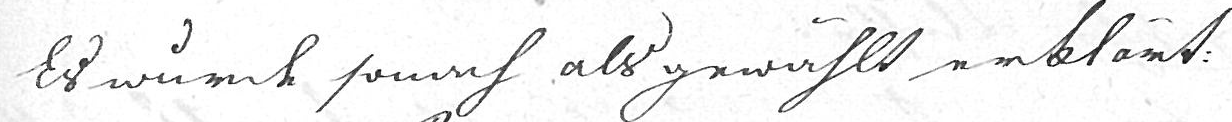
Es wurden sonach als gewählt erklärt:
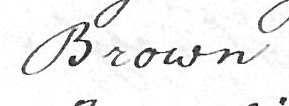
Brown
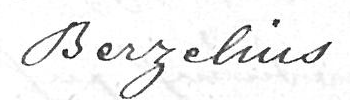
Berzelius
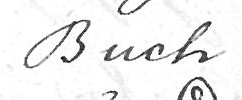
Buch
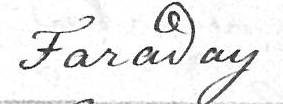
Faraday
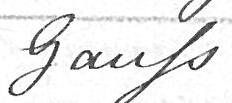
Gauss
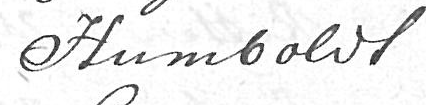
Humboldt
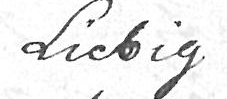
LIebig
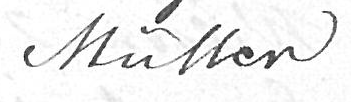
Müller
